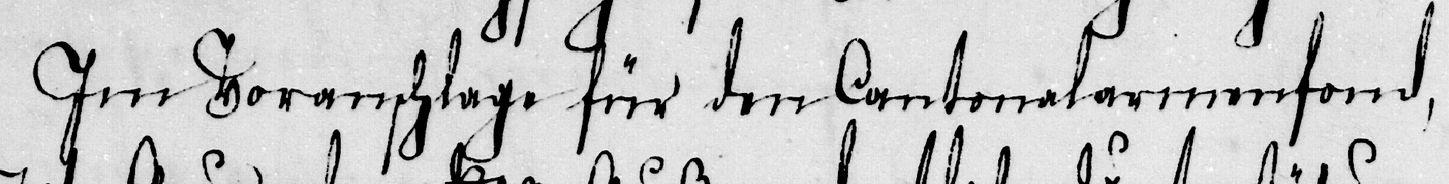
Im Voranschlag für den Cantonalarmenfond,
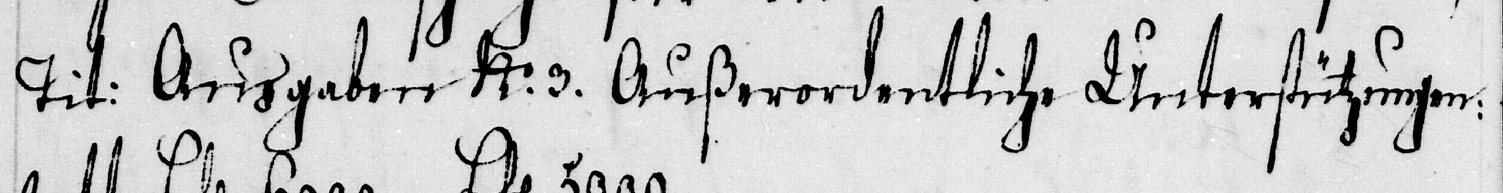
Tit: Ausgaben No. 3. Außerordentliche Unterstützungen:
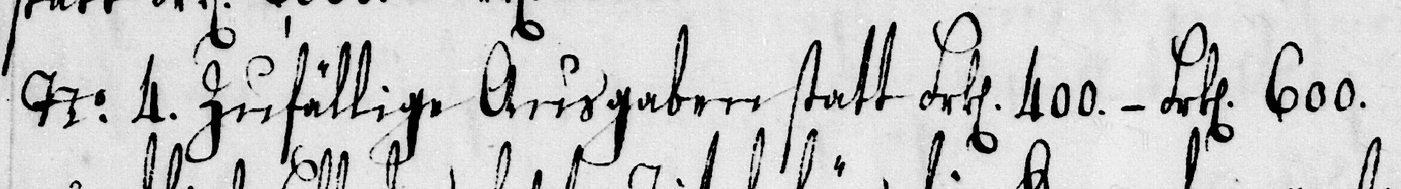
No. 4. Zufällige Ausgaben statt Frk[en]. 400.
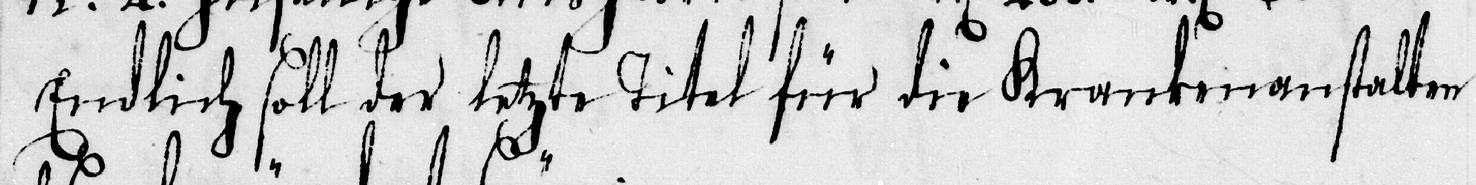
Endlich soll der letzte Titel für die Krankenanstalten
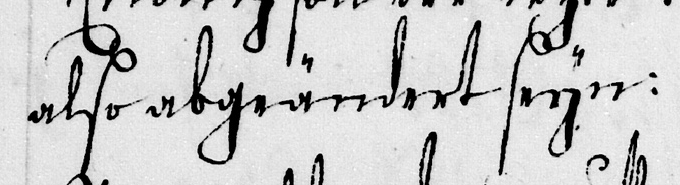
also abgeändert seyn:
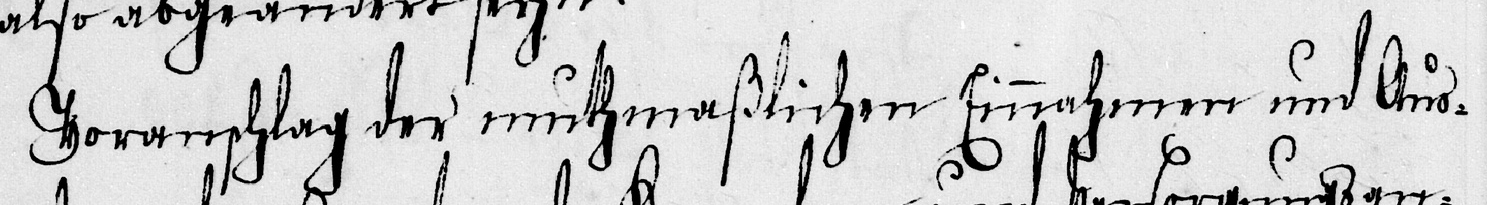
Voranschlag der muthmaßlichen Einnahmen und Aus¬
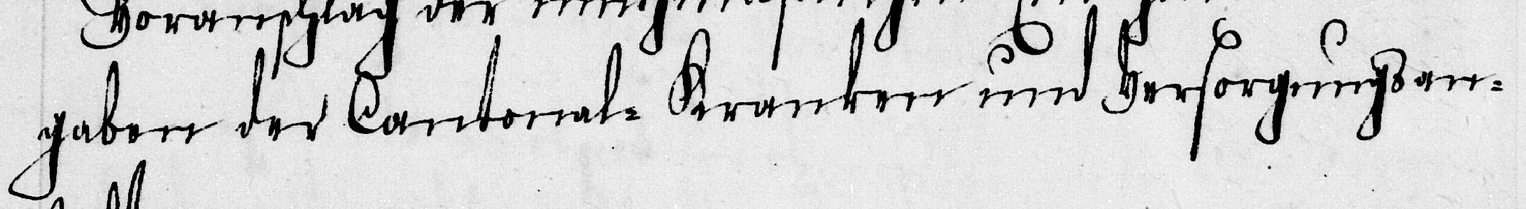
gaben der Cantonal-Kranken[-] und Versorgungsan¬
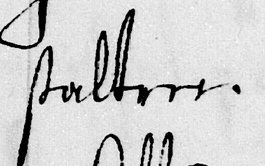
stalten.
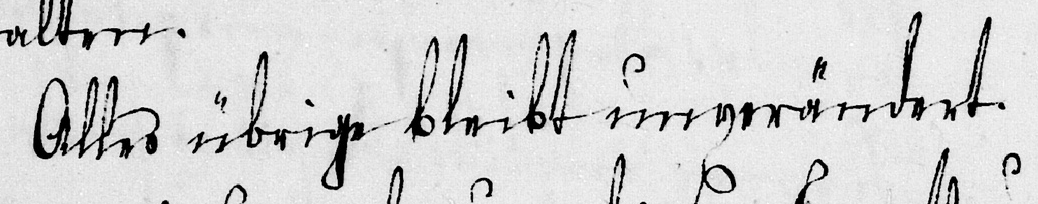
Alles übrige bleibt unverändert.
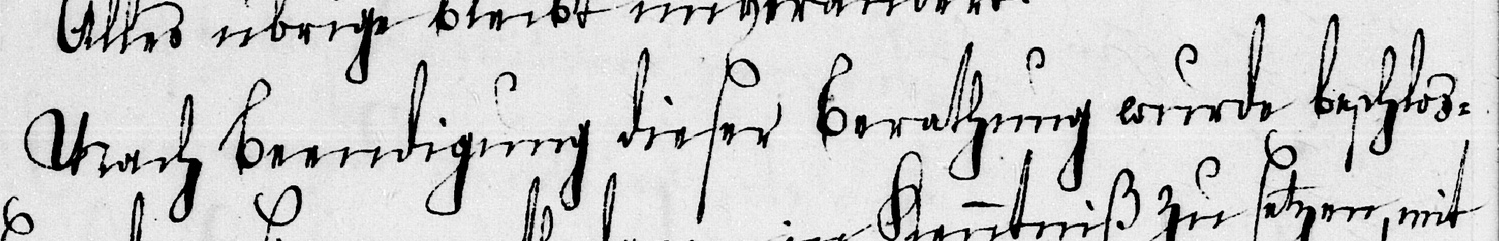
Nach Beendigung dieser Berathung wurde beschlo¬
